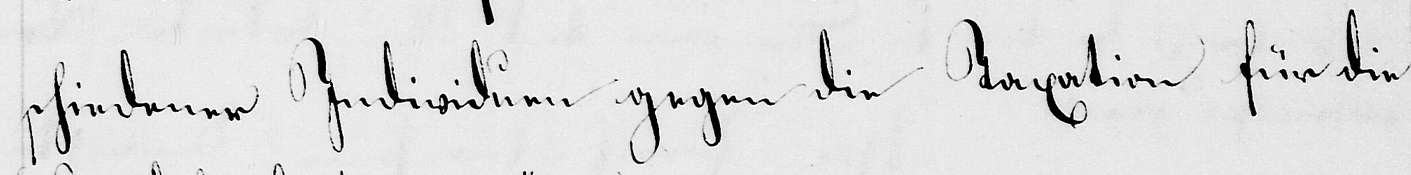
schiedner Individuen gegen die Taxation für die
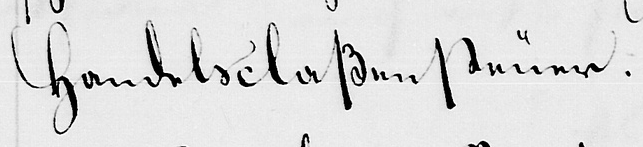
Handelsclaßensteuer.
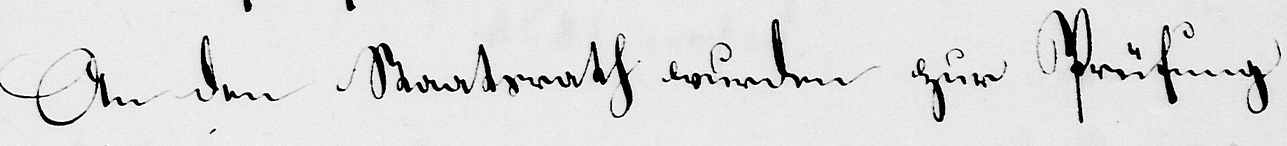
An den Staatsrath wurden zur Prüfung
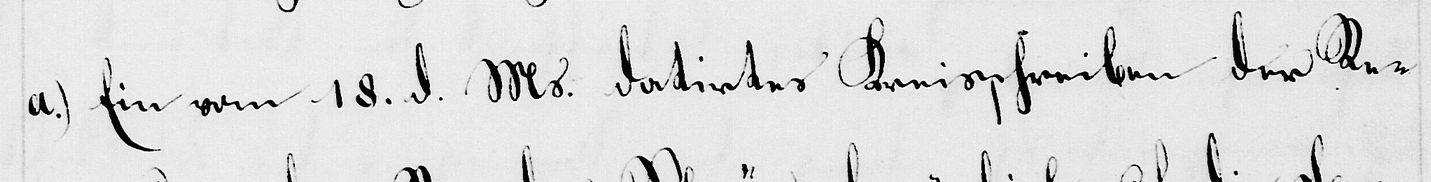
a.) Ein vom 18. d. Ms. datirtes Kreisschreiben der Re¬
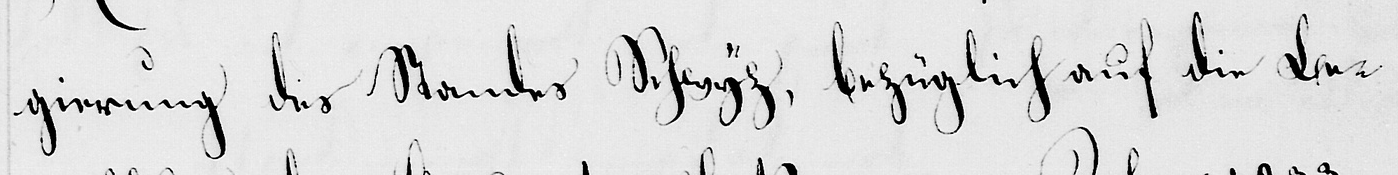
gierung des Standes Schwyz, bezüglich auf die Be¬
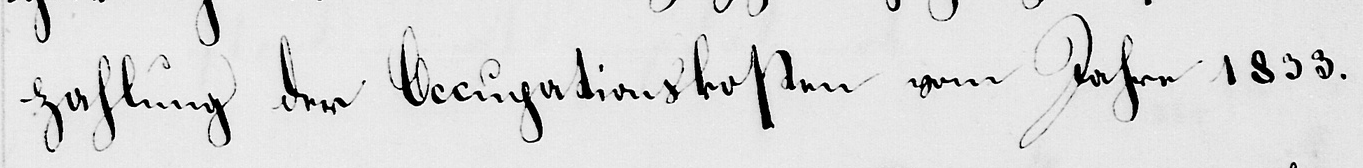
zahlung der Occupationskosten vom Jahre 1833.
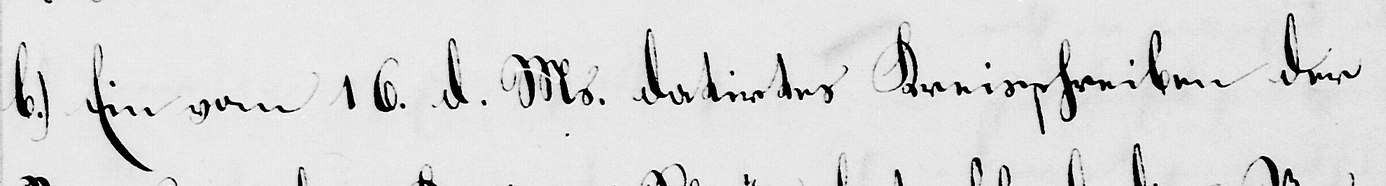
b.) Ein vom 16. d. Ms. datirtes Kreisschreiben der
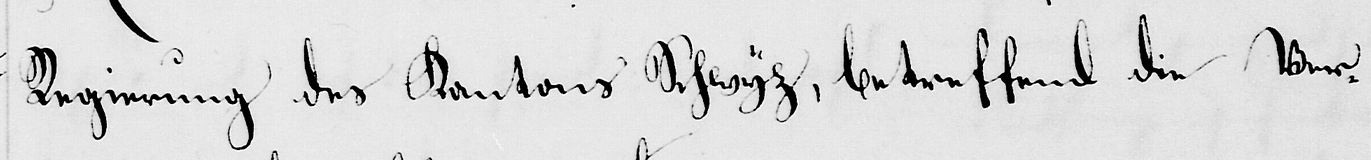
Regierung des Kantons Schwyz , betreffend die Ver¬
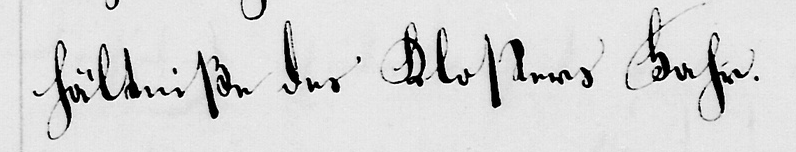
hältniße des Klosters Fahr.
